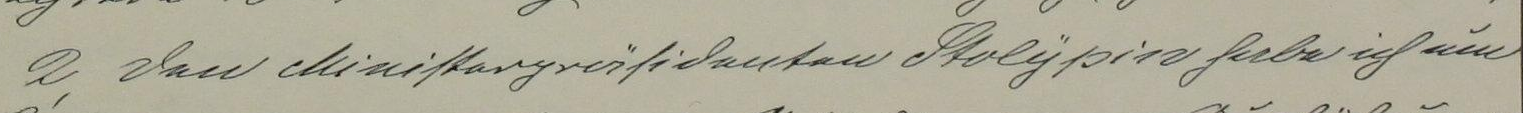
2. Den Ministerpräsidenten Stolypin habe ich um
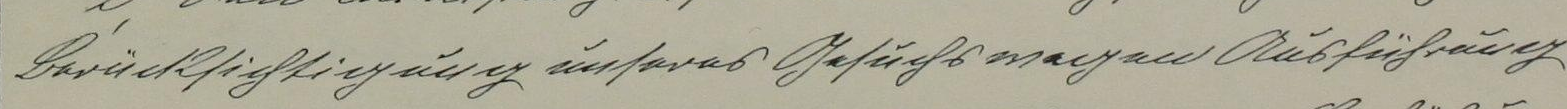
Berücksichtigung unseres Gesuchs wegen Ausführung
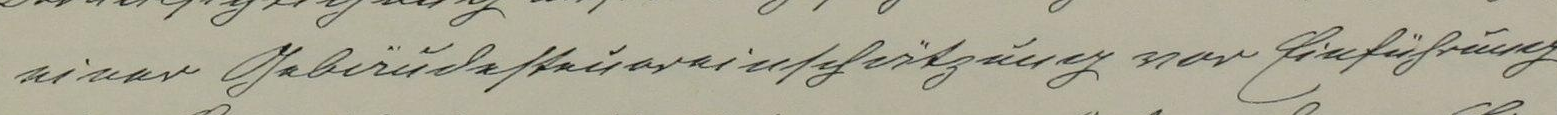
einer Gebäudesteuereinschätzung vor Einführung
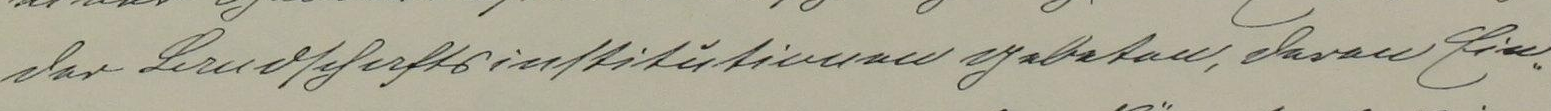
der Landschaftsinstitutionen gebeten, deren Ein-
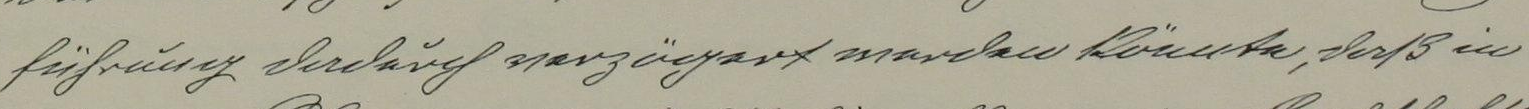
führung dadurch verzögert werden könnte, daß in
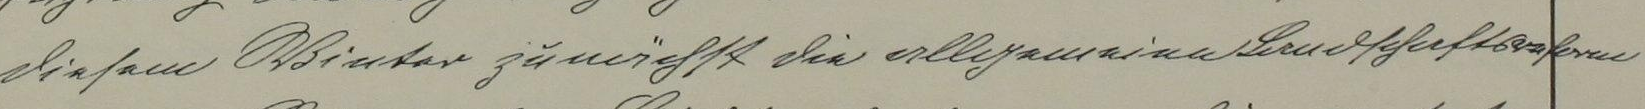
diesem Winter zunächst die allgemeine Landschaftsreform
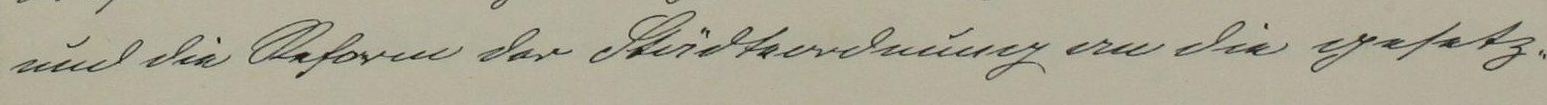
und die Reform der Städteordnung an die gesetz-
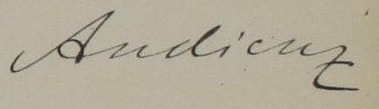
Audienz
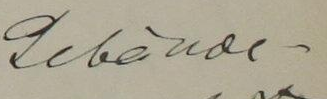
Gebäude-
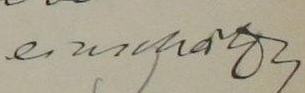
einschätzung
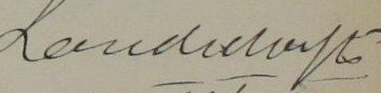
Landschafts
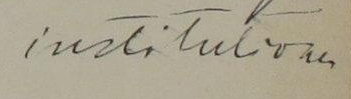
institutionen
